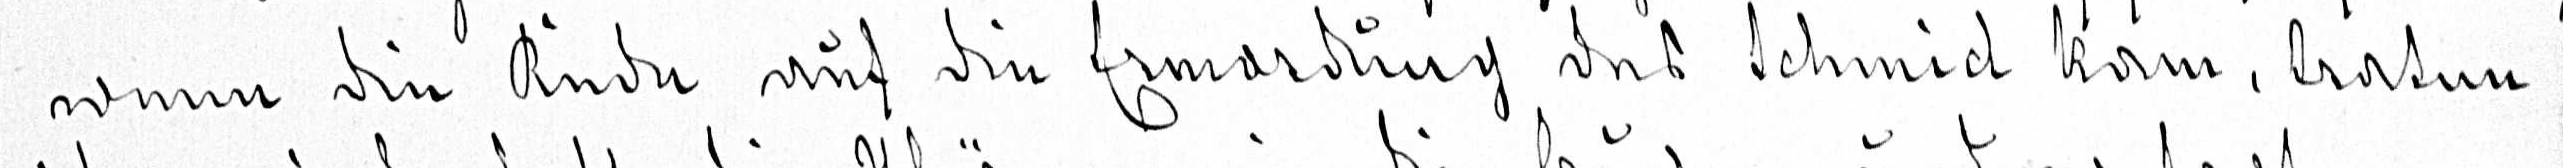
wenn die Rede auf die Ermordung des Schmid kam, traten
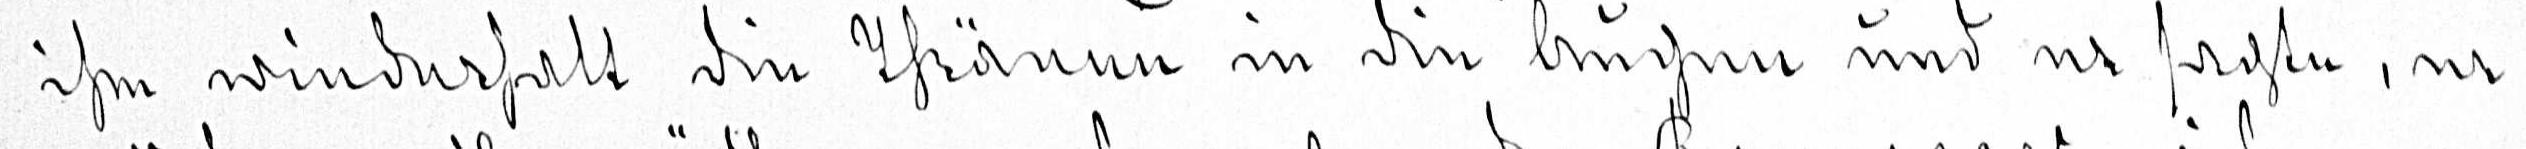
ihm wiederholt die Thränen in die Augen und er sagte, er
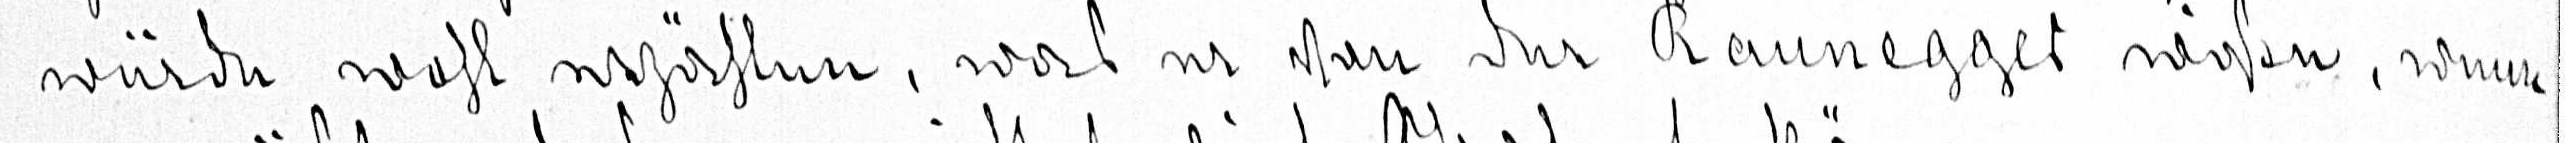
würde wohl erzählen, was er von der Raunegger wiße, wenn
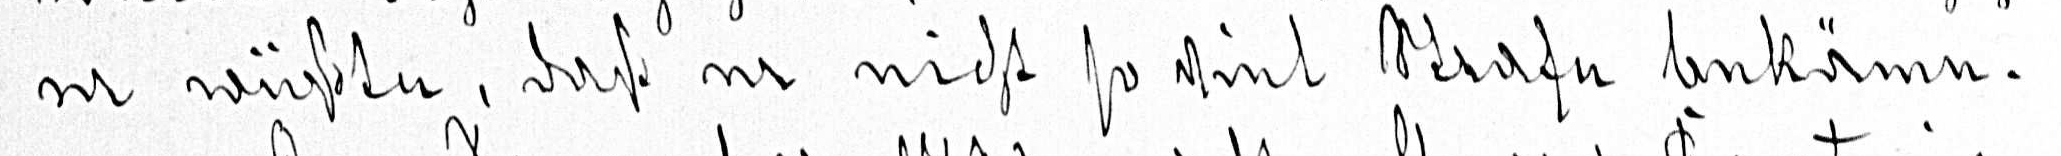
er wüßte, daß er nicht so viel Strafe bekäme.
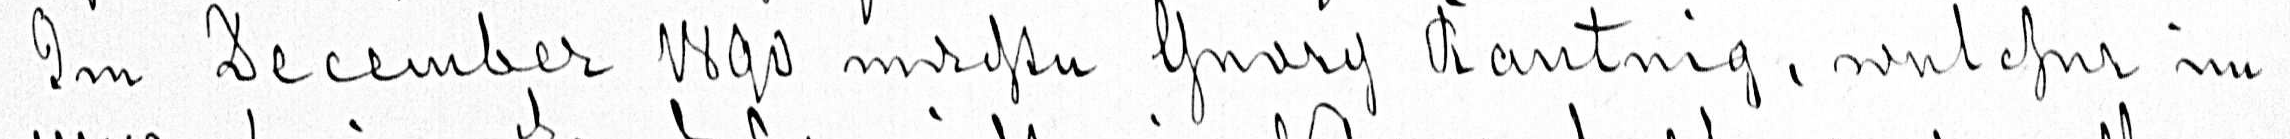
Im December 1890 machte Georg Rautnig, welcher im
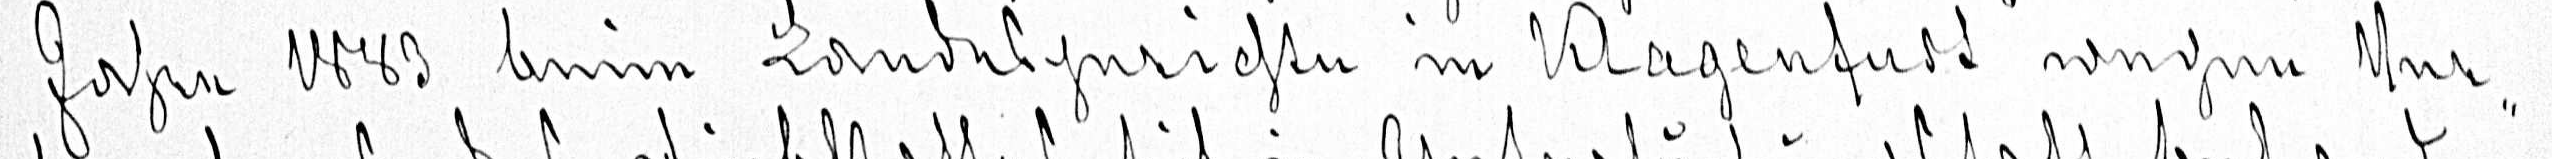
Jahre 1883 beim Landesgerichte in Klagenfurt wegen Ver¬
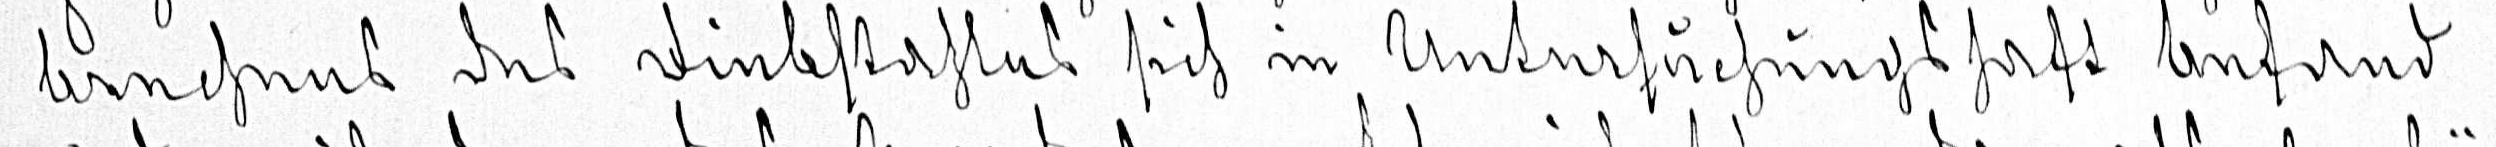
brechens des Diebstahles sich in Untersuchungshaft befand
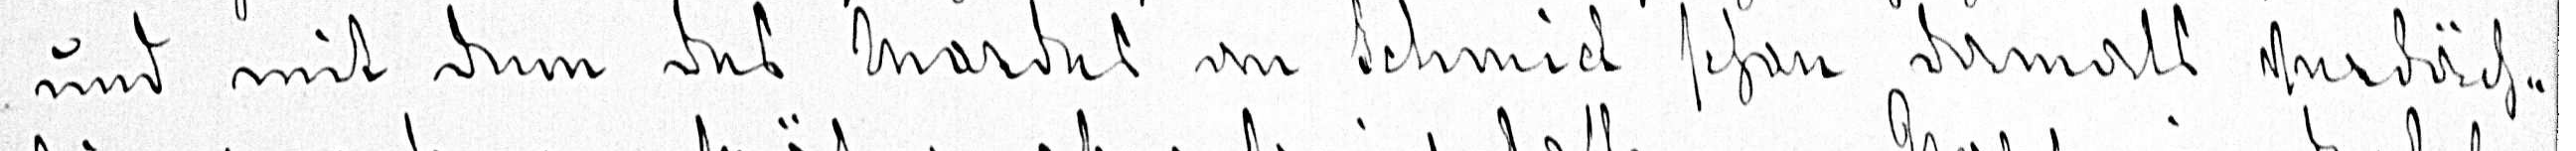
und mit dem des Mordes an Schmid schon damals verdäch¬
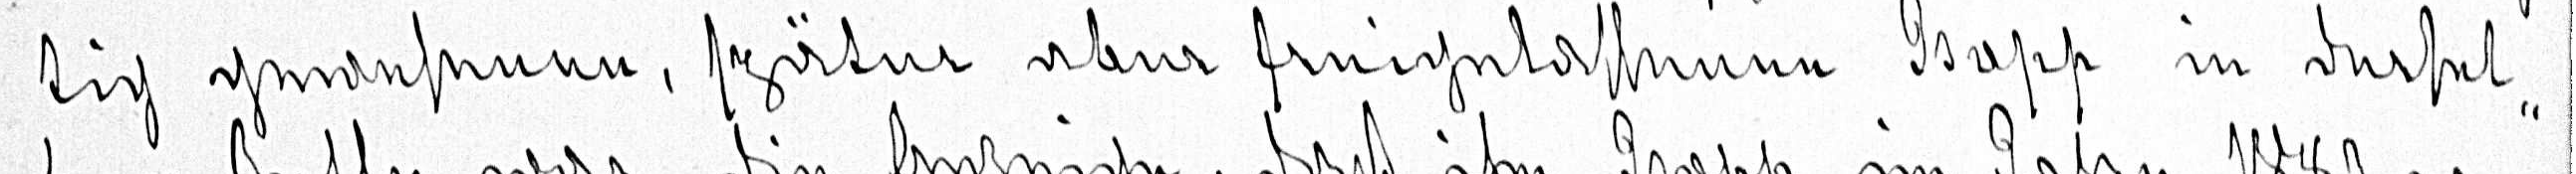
tig gewesenen, später aber freigelassenen Isopp in dersel¬
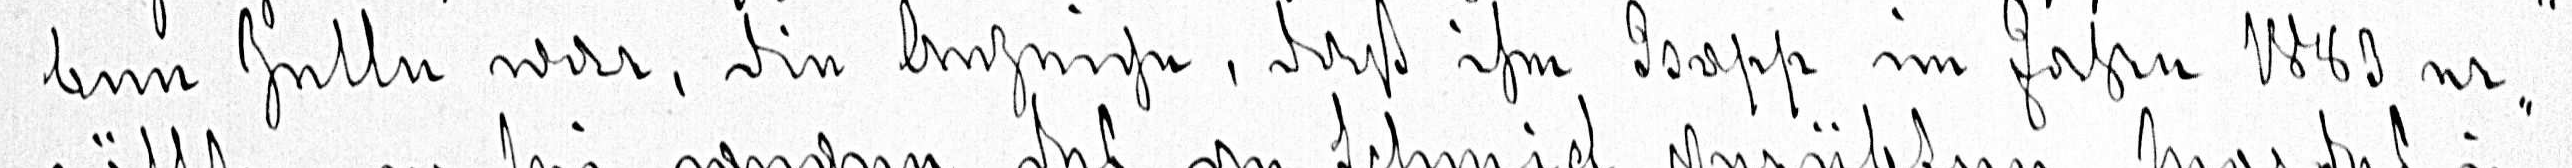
ben Zelle war, die Anzeige, daß ihm Isopp im Jahre 1883 er¬
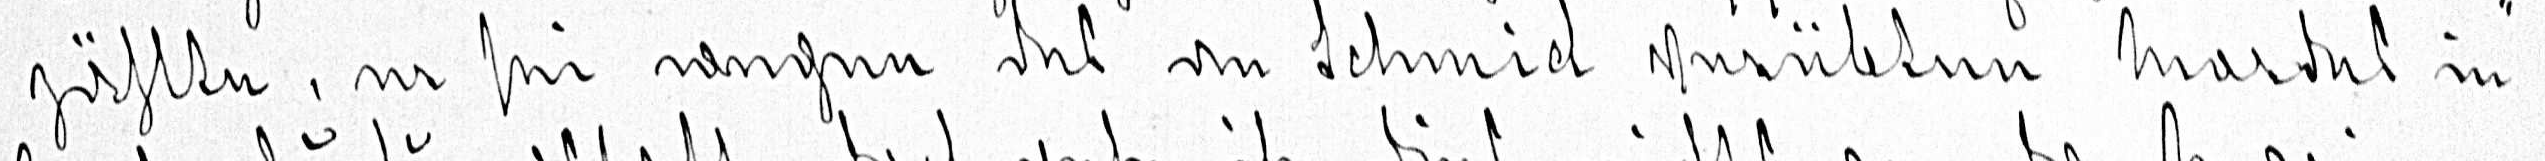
zählte, er sei wegen des an Schmid verübten Mordes in
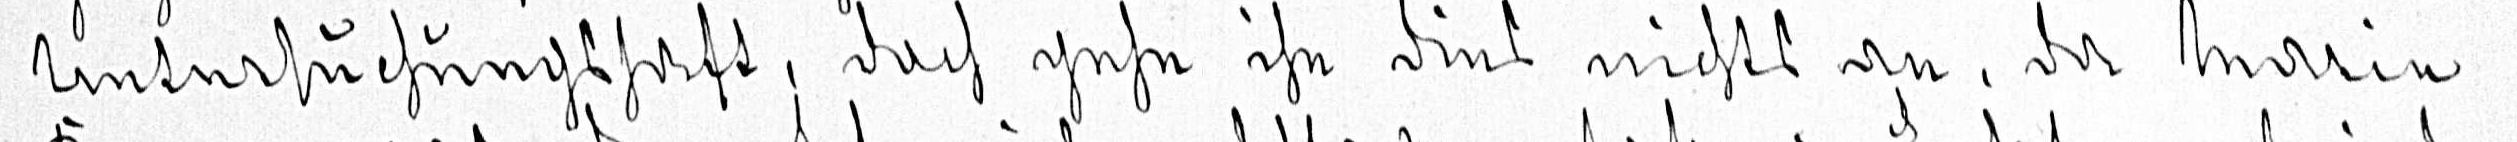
Untersuchungshaft, doch gehe ihn dies nichts an, da Marie
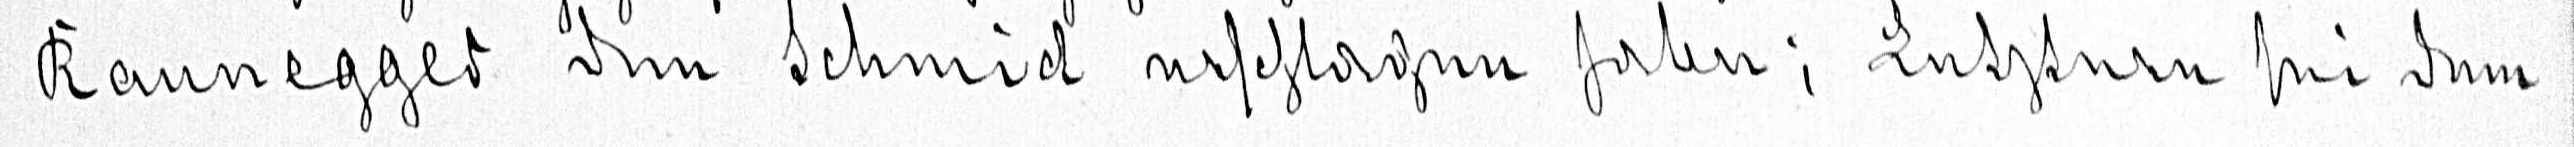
Raunegger den Schmid erschlagen habe; Letztere sei dem
